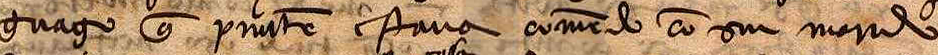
guago q̄ prnt̄e estaua comēdo c̄o seu marido
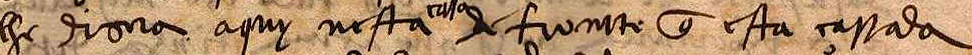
lhe disera aquy nesta casa defromte q̄ esta çarrada
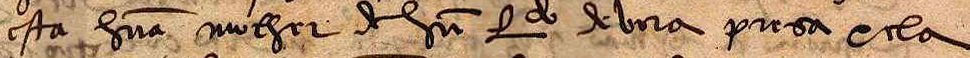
esta hūa molher de hū Ldo devora presa e ela
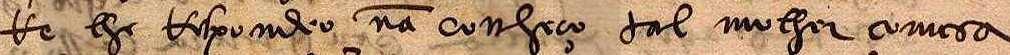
Re lhe Respondeo nā conheço tal molher comesa
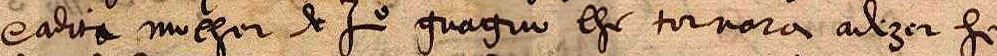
e a dita molher de Jo guaguo lhe tornara a dizer he
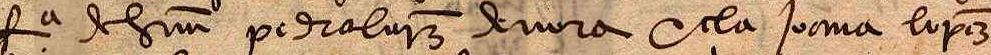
fa de hūu pedralurz̄ deuora e ela Joana lopez
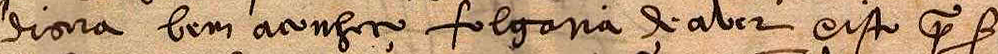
disera bem a conheço folgaria de a ver e isto p̄o ꞩ
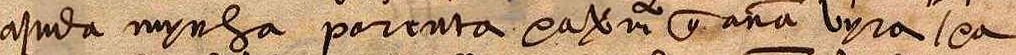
aJnda mynha parenta e aꝟ mto q̄ a nā vyra / e a
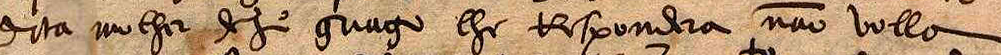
dita molher de Jo guago lhe Respondera não volla
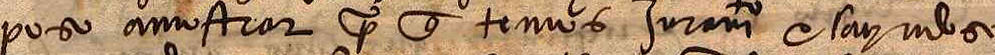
poso amostrar p̄oq̄ temos Juramto e sayndose
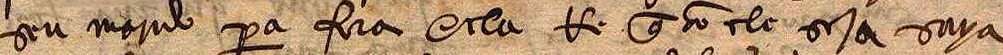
seu marido ꝑa fora e ela Re q̄ cō ele se Ja saya
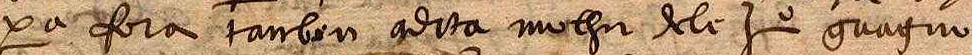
ꝑa fora tanben a dita molher dele Jo guaguo
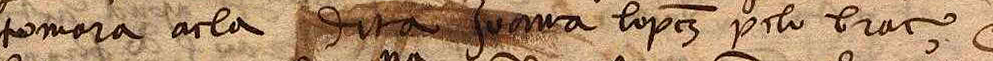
tomara a ela dita Joana lopez pelo braço e
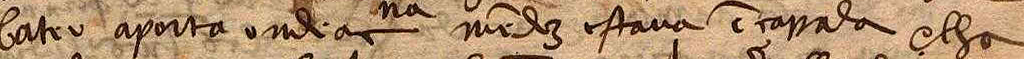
bateo a porta onde a cna mēdez estaua ēçarrada e lha
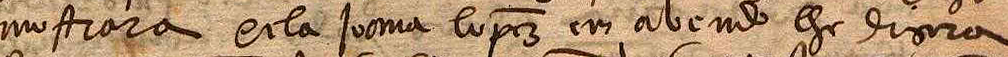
mostrara e ela Joana lopez em a vendo lhe disera
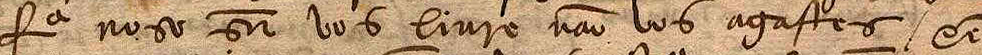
fa noso s̄or vos liure não vos agastes / e ē
